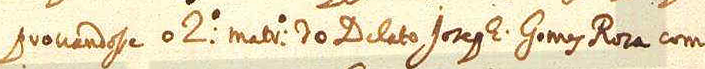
prouandosse o 2o. matro. do Delato Jozeph. Gomes Roza com
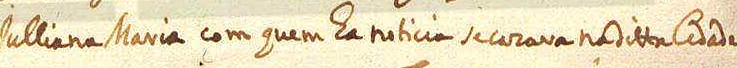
Julliana Maria com quem ha noticia se cazara na ditta Cidade
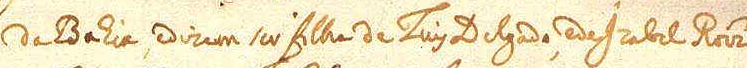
da Bahia, e dizem ser filha de Luis Delgado, e de Jzabel Roiz̄
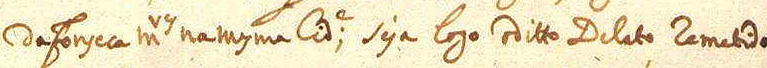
da fonseca mres. na mesma Cide; seja logo o ditto Delato Remetido
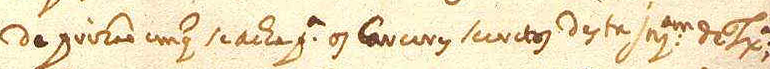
da prizaõ em q̄ se acha pa. os Carceres secretos desta Jnqam: de Lxa;
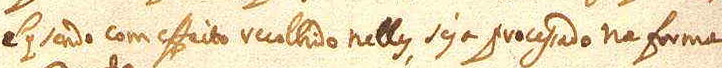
e q̄ sendo com effeito recolhido nelles, seja processado na forma
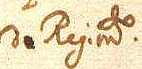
do Regimto.
